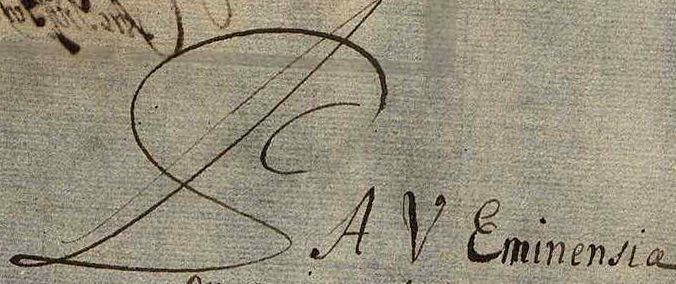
P A V Eminensia
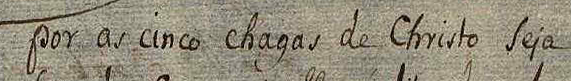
por as cinco chagas de Christo seja
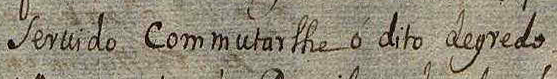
Seruido commutarlhe o dito degredo
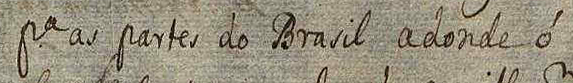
p.a as partes do Brasil adonde ó
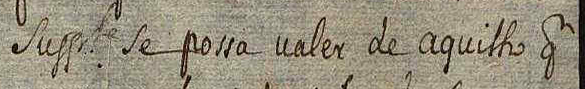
Supp.te se possa ualer de aquilho q̄
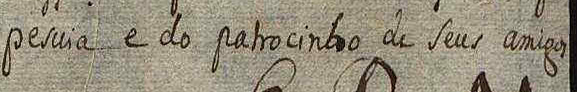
pesuia e do patrocinho de seus amigos
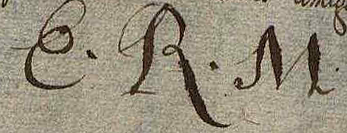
E. R. M.
